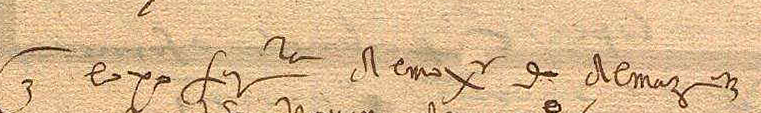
item lopo ferra Almoxr de Almazem
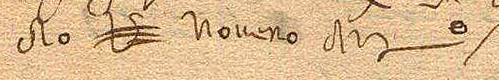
Ao R noueno Arto /.
